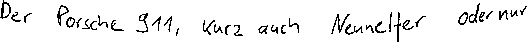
Der Porsche 911, kurz auch Neunelfer oder nur
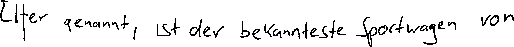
Elfer genannt, ist der bekannteste Sportwagen von
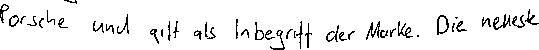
Porsche und gilt als Inbegriff der Marke. Die neueste
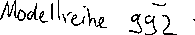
Modellreihe 992
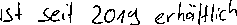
ist seit 2019 erhältlich.
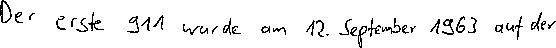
Der erste 911 wurde am 12. September 1963 auf der
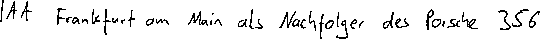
IAA in Frankfurt am Main als Nachfolger des Porsche 356
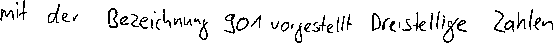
mit der Bezeichnung Porsche 901 vorgestellt. Dreistellige Zahlen
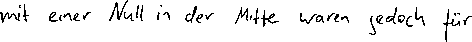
mit einer Null in der Mitte waren jedoch für
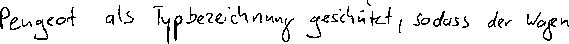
Peugeot als Typbezeichnung geschützt, sodass der Wagen
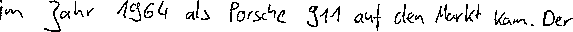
im Jahr 1964 als Porsche 911 auf den Markt kam.Der
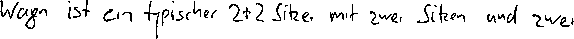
Wagen ist ein typischer 2+2-Sitzer mit zwei Sitzen und zwei
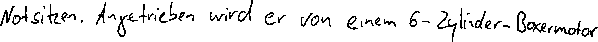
Notsitzen. Angetrieben wird er von einem 6-Zylinder- Boxermotor
